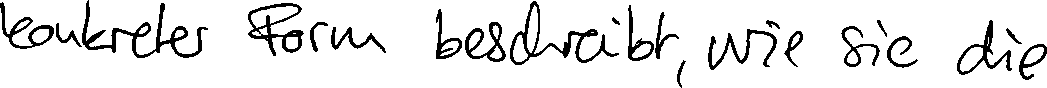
konkreterer Form beschreibt, wie sie die
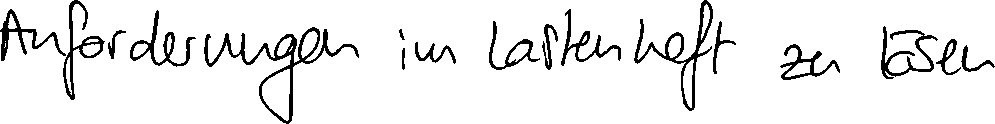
Anforderungen im Lastenheft zu lösen
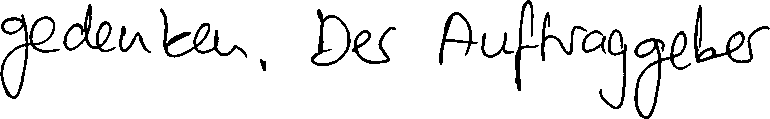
gedenken. Der Auftraggeber
